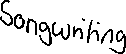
Songwriting
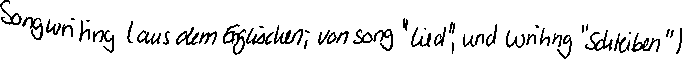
Songwriting (aus dem Englischen; von song "Lied", und writing "Schreiben")
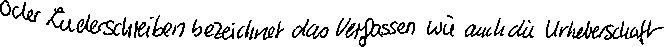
oder Liederschreiben bezeichnet das Verfassen wie auch die Urheberschaft
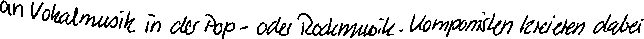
an Vokalmusik in der Pop- oder Rockmusik. Komponisten kreieren dabei
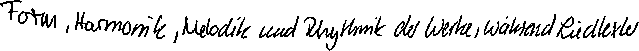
Form, Harmonik, Melodik und Rhythmik der Werke, während Liedtexter
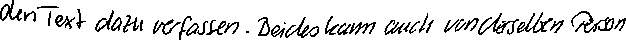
den Text dazu verfassen. Beides kann auch von derselben Person
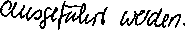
ausgeführt werden.
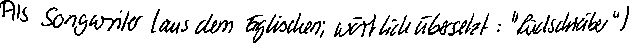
Als Songwriter (aus dem Englischen; wörtlich übersetzt: "Liedschreiber")
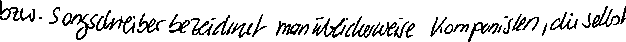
bzw. Songschreiber bezeichnet man üblicherweise Komponisten, die selbst
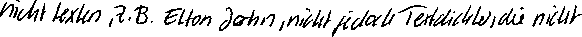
nicht texten, z. B. Elton John, nicht jedoch Textdichter, die nicht
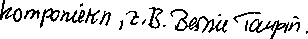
komponieren, z. B. Bernie Taupin.
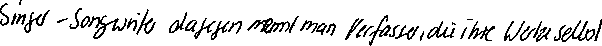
Singer-Songwriter dagegen nennt man Verfasser, die ihre Werke selbst
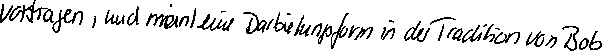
vortragen, und meint eine Darbietungsform in der Tradition von Bob
